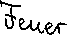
Feuer
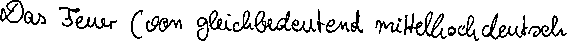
Das Feuer (von gleichbedeutend mittelhochdeutsch
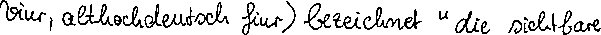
viur, althochdeutsch fiur) bezeichnet "die sichtbare
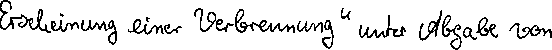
Erscheinung einer Verbrennung" unter Abgabe von
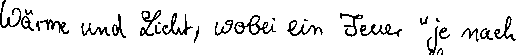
Wärme und Licht, wobei ein Feuer "je nach
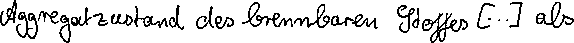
Aggregatzustand des brennbaren Stoffes [...] als
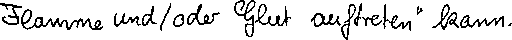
Flamme und/oder Glut auftreten" kann.
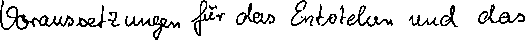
Voraussetzungen für das Entstehen und das
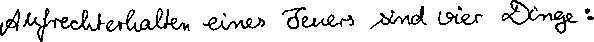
Aufrechterhalten eines Feuers sind vier Dinge:
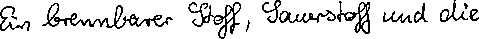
Ein brennbarer Stoff, Sauerstoff und die
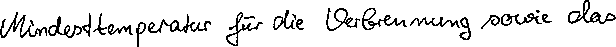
Mindesttemperatur für die Verbrennung sowie das
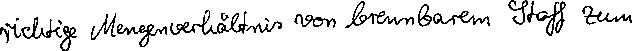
richtige Mengenverhältnis von brennbarem Stoff zum
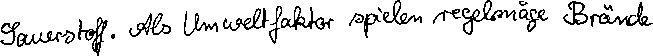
Sauerstoff.Als Umweltfaktor spielen regelmäßige Brände
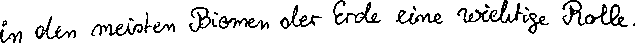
in den meisten Biomen der Erde eine wichtige Rolle.
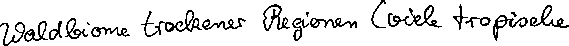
Waldbiome trockener Regionen (viele tropische
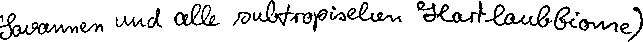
Savannen und alle subtropischen Hartlaubbiome)
